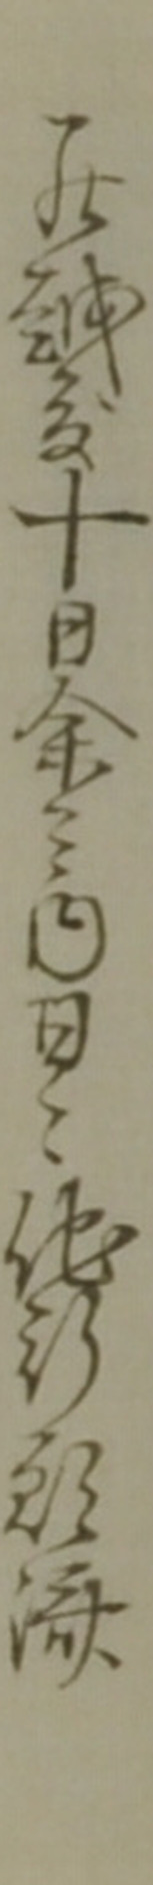罷越度十日余之内日々他行願済
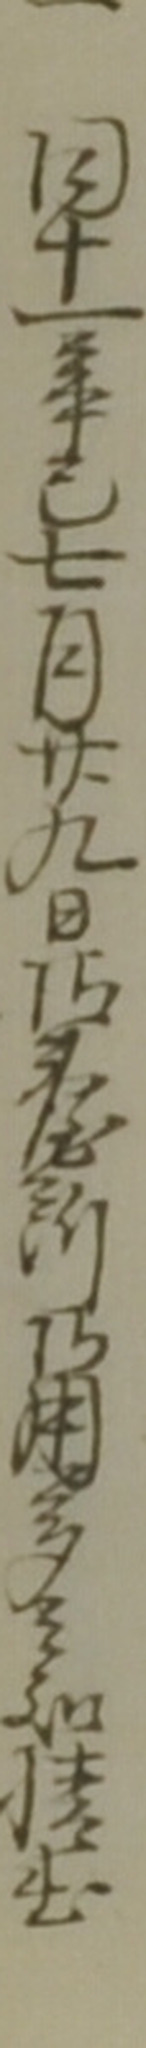一同十一辛巳七月廿九日御台所御用多之処情出
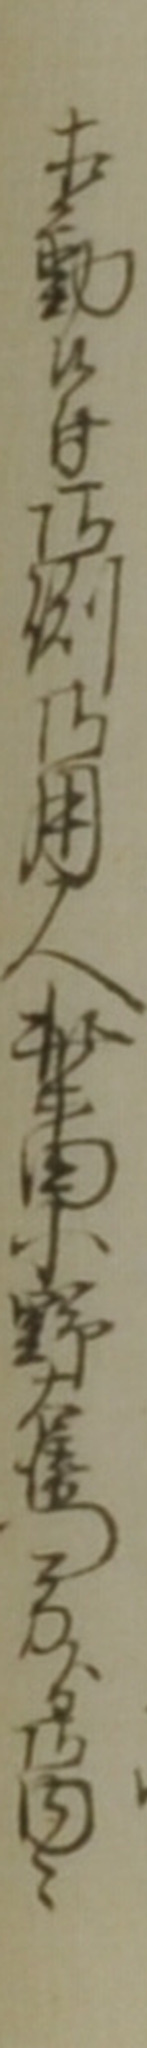相勤候付御側御用人柴田小野右衛門方ゟ御内々
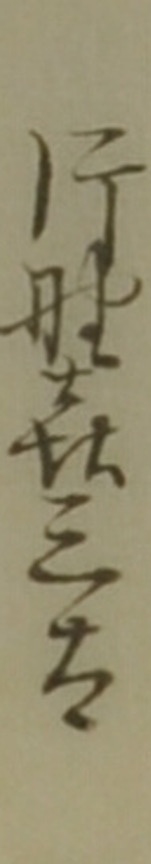片野喜三太
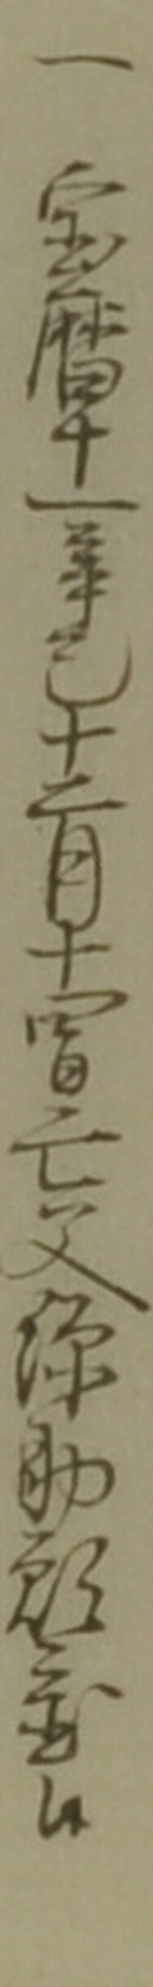一宝暦十一辛巳十二月十四日亡父源助願置候
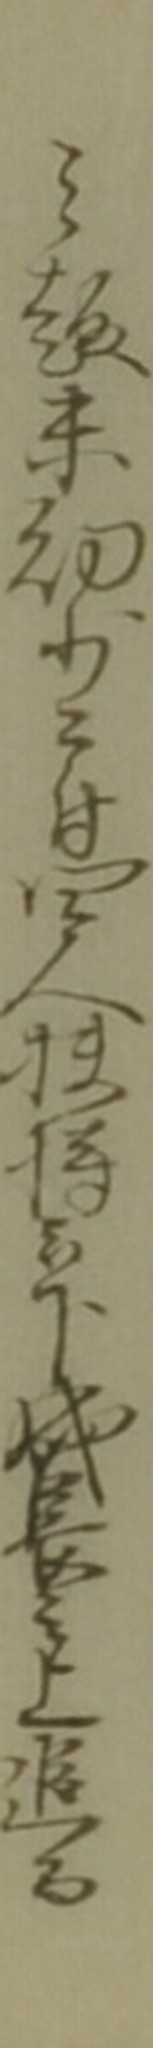之趣末幼少ニ付四人扶持被下成長之上追而
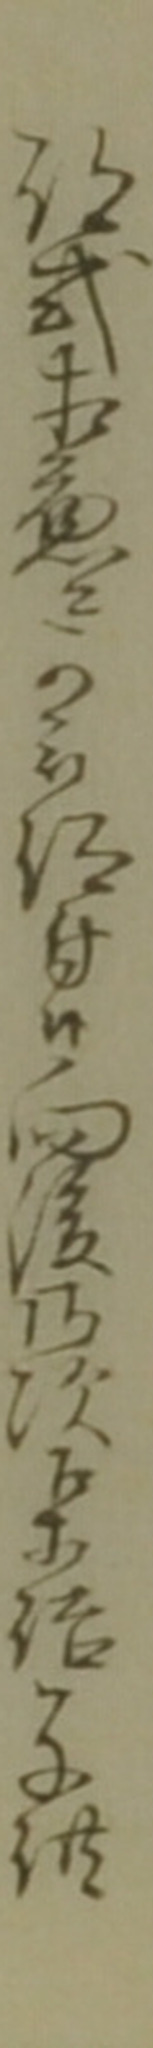跡式相応可被仰付候向後御次江等詰子供
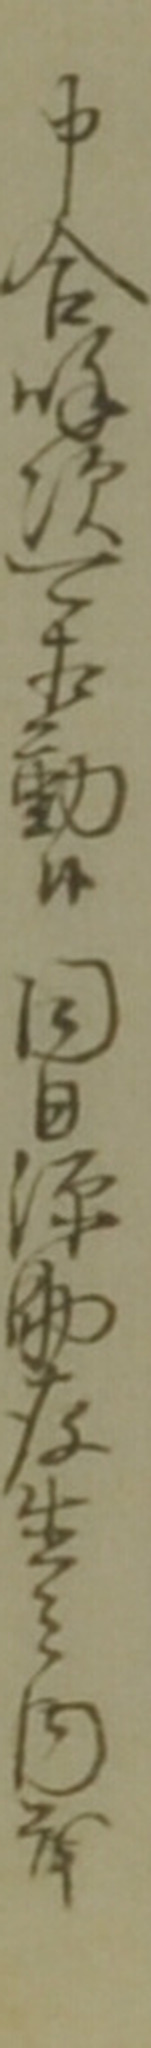申合呼次可相勤候同日源助存生之内茂
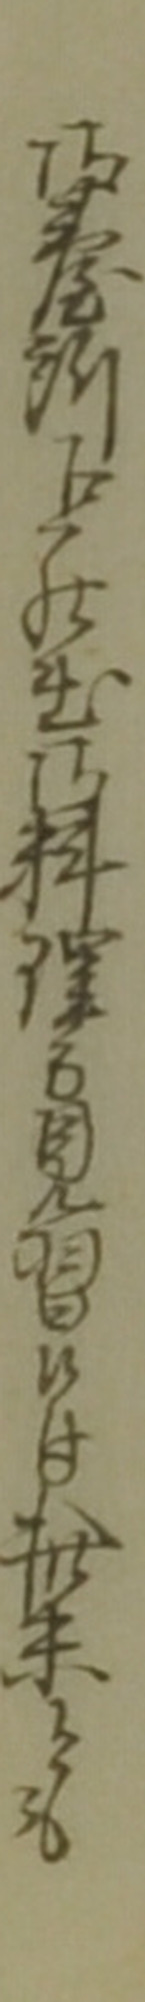御台所江罷出御料理方見習候付此末
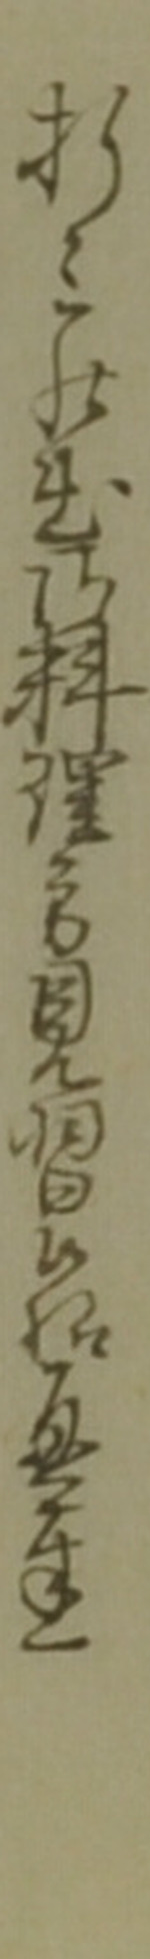折々罷出御料理方見習候様通達
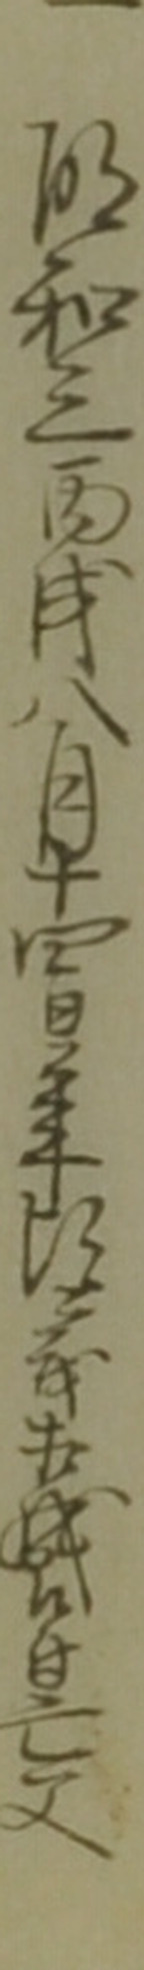一明和三丙戌八月十四日年頃ニ茂相成候付亡父
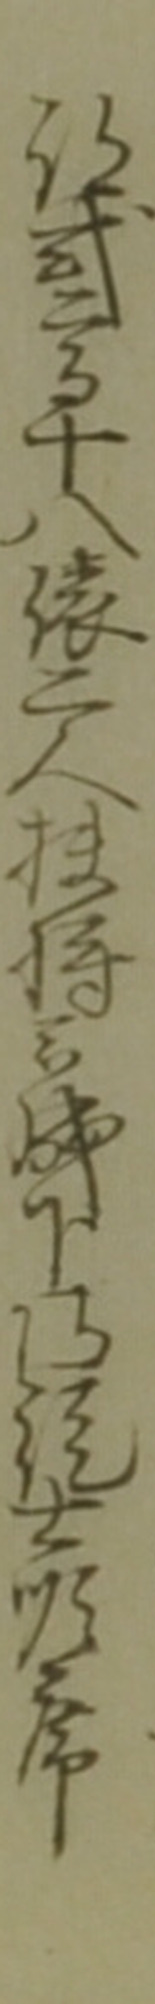跡式高十八俵二人扶持被成下御徒士順席
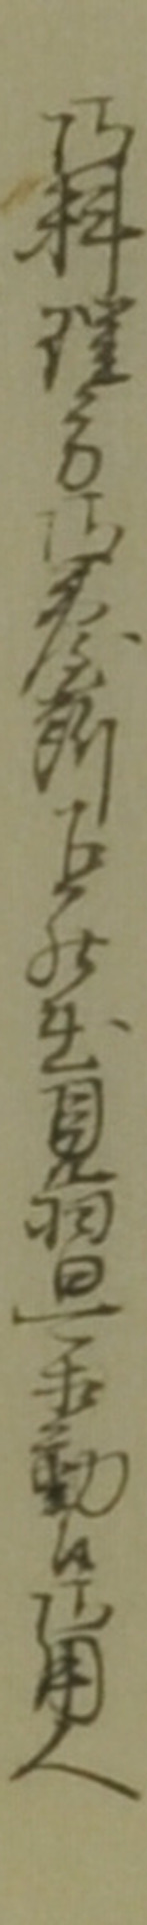御料理方御台所江罷出見習可相勤候御用人
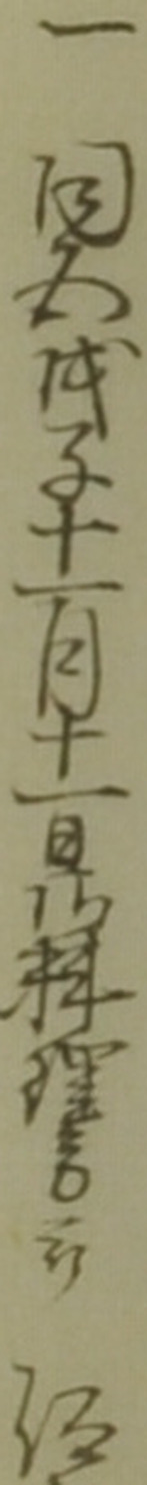一同五戊子十一月十一日御料理方被仰付

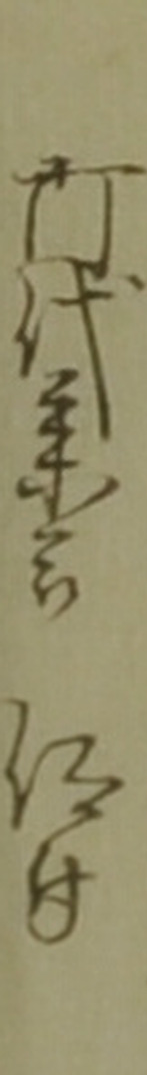御代参被仰付
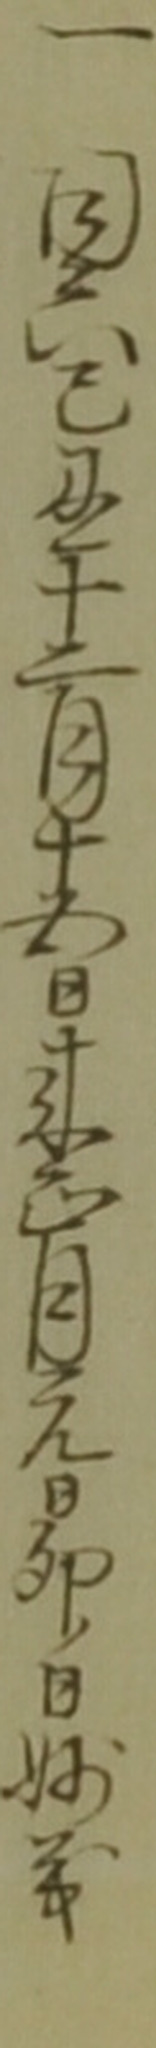一同六己丑十二月十五日来正月元日卯日妙義
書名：無足廃家（壱）
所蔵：伊那市立高遠町図書館・合同会社AMANE
